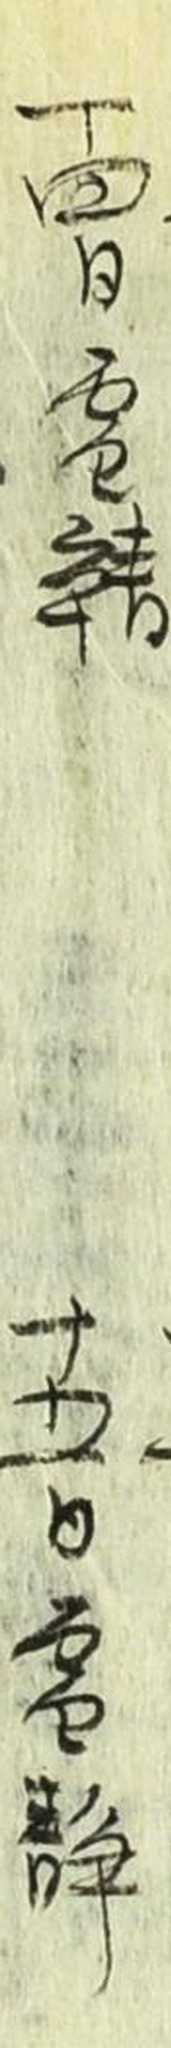十四日雪静十五日雪静
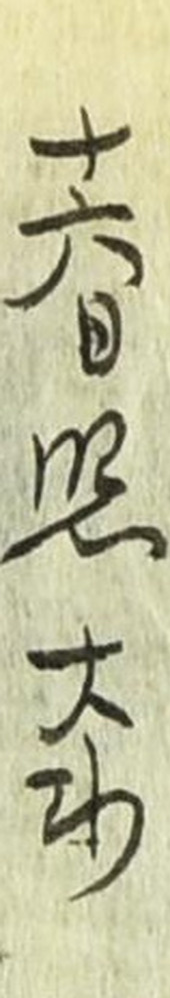十六日照大氷
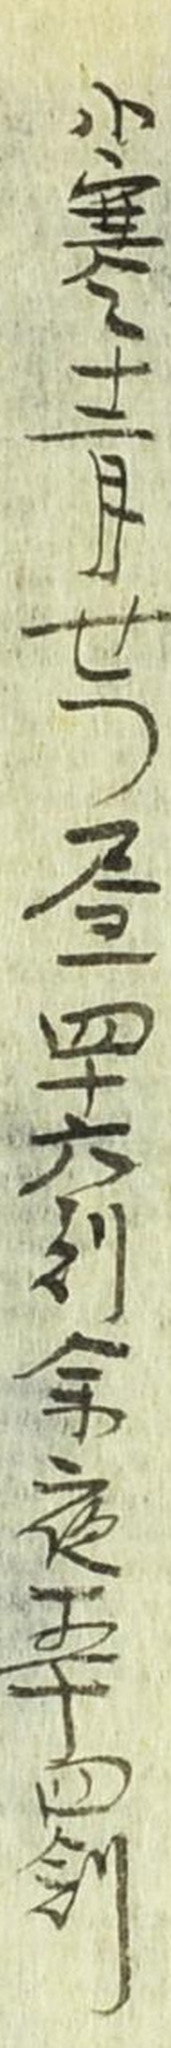小寒十二月せつ昼四十六刻余夜五十四刻
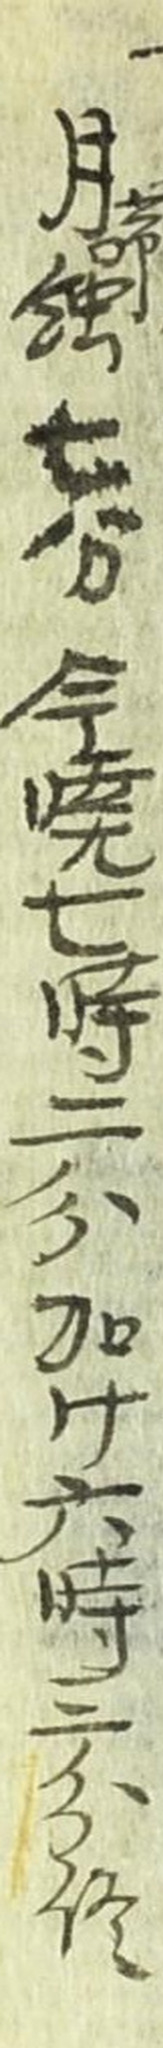月「帯」蝕七分今暁七時二分かけ六時三分終
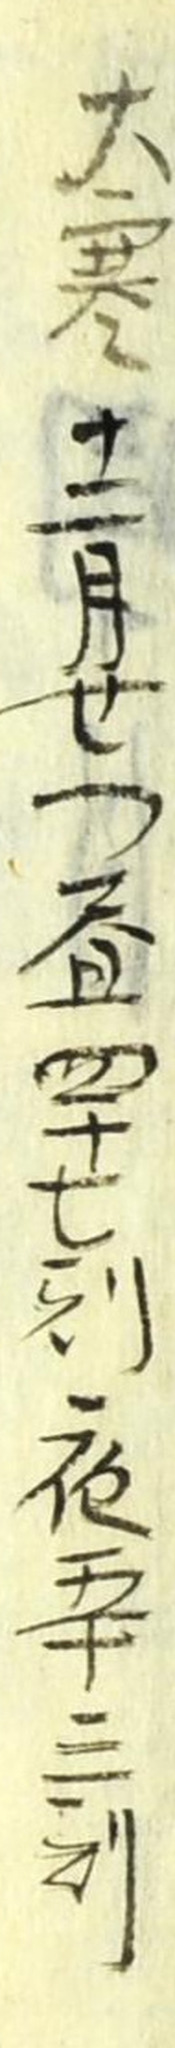大寒十二月せつ昼四十七刻夜五十三刻
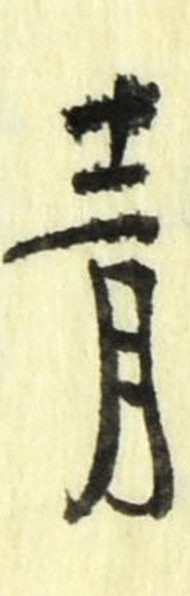十一月

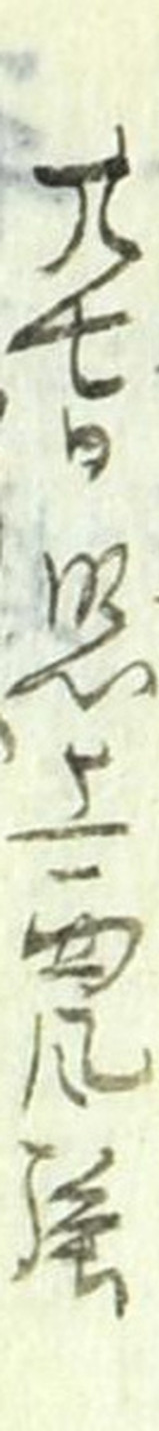廿六日上西風雪
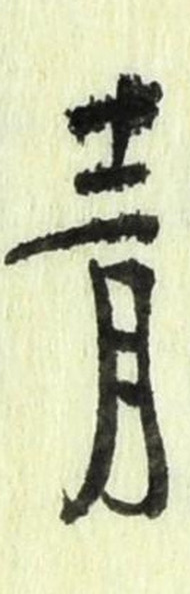十二月
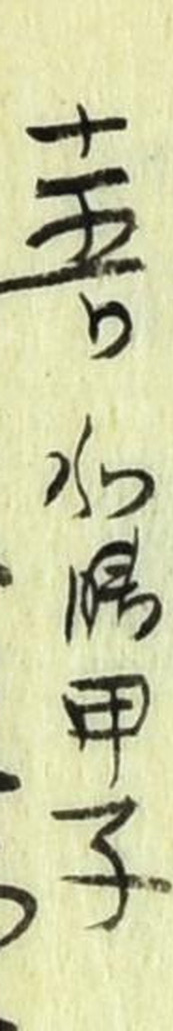十五日和晴甲子
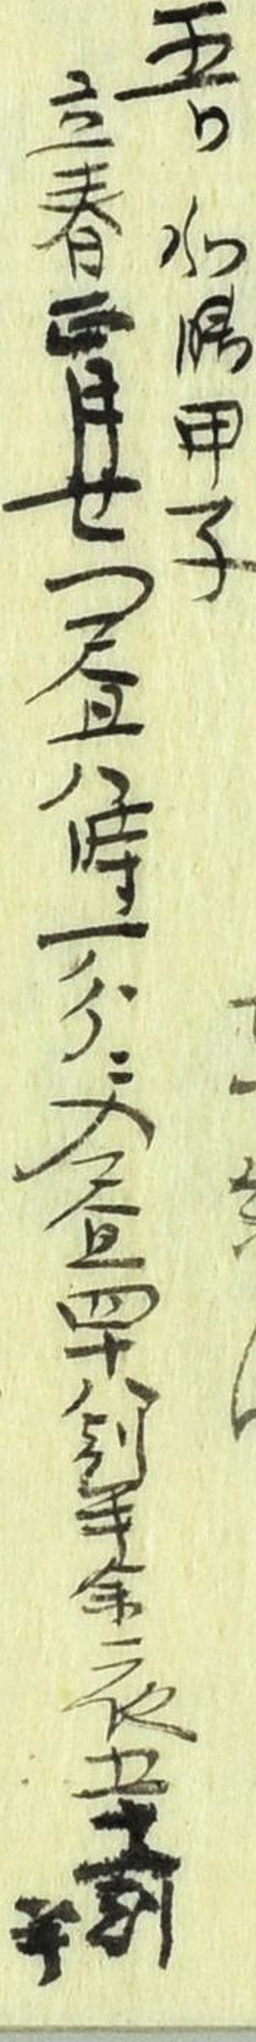立春正月せつ昼八時一分ニ入昼四十八刻半余夜五十一刻半
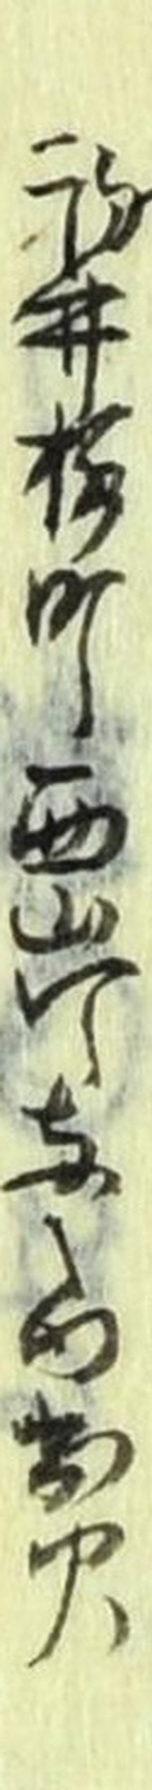福井柳町西山丁両之内出火
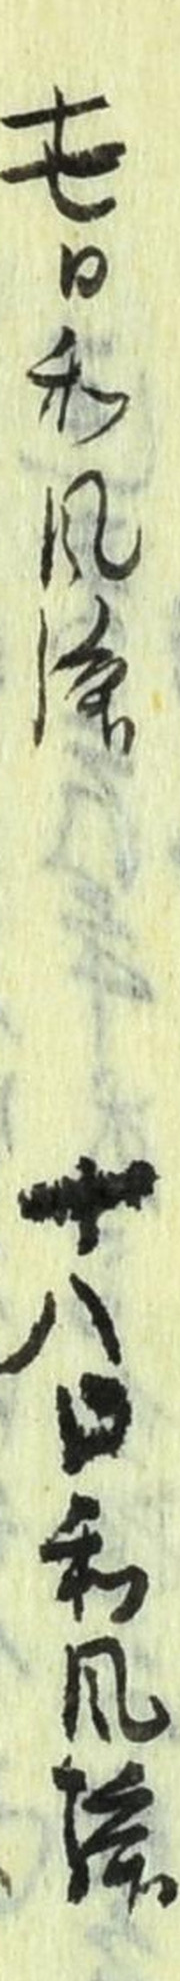十七日和風強十八日和風強
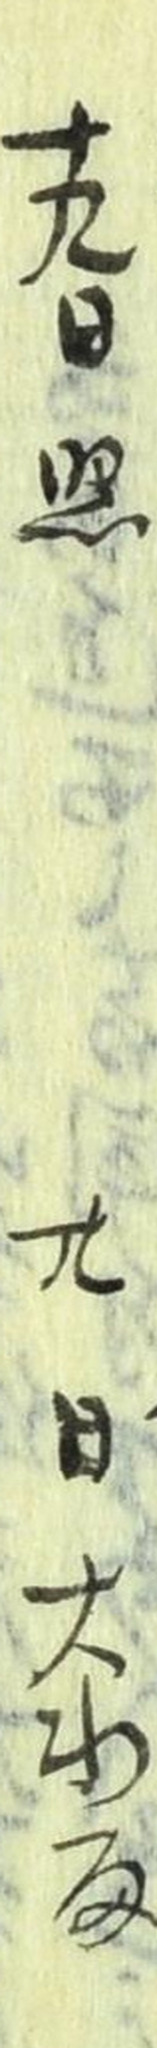十九日照廿日大氷雨
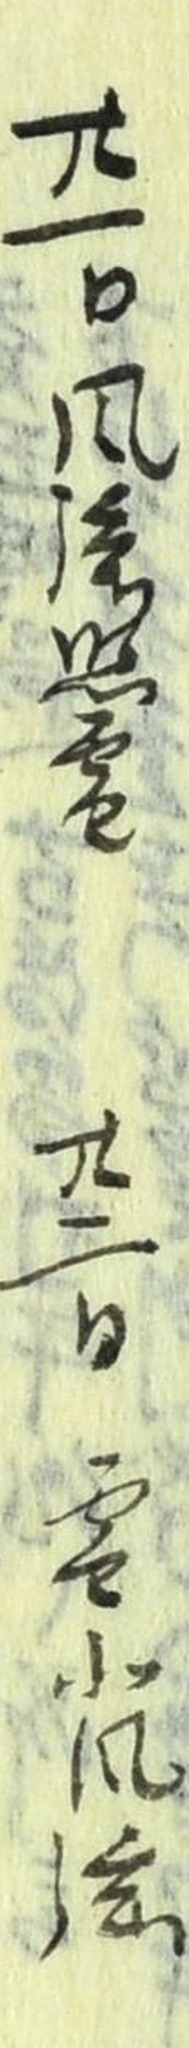廿一日風強照雪廿二日雪北風強
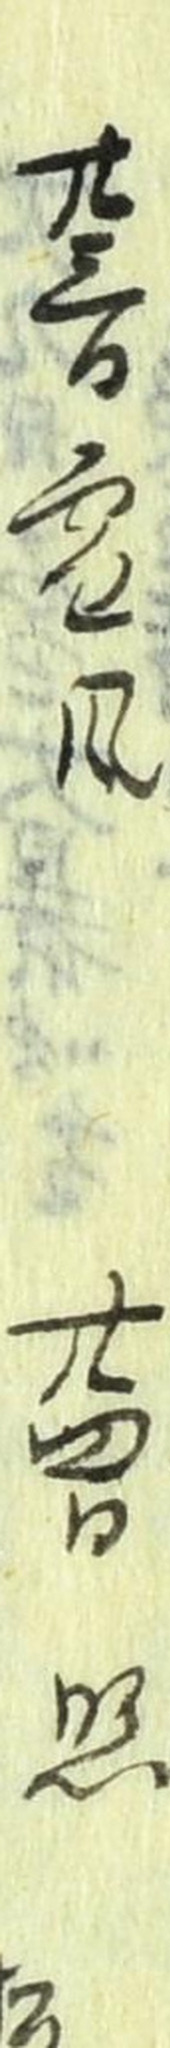廿三日雪風廿四日照
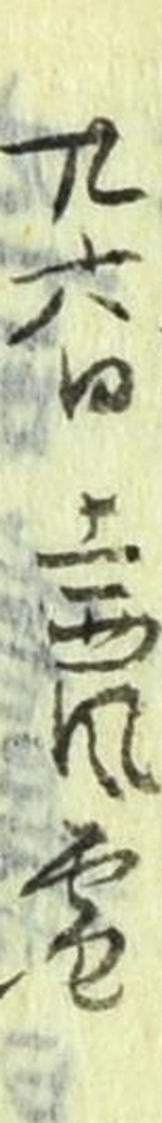廿六日上西風雪
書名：（日記）
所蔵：福井県文書館 Fukui Prefectural Archives
